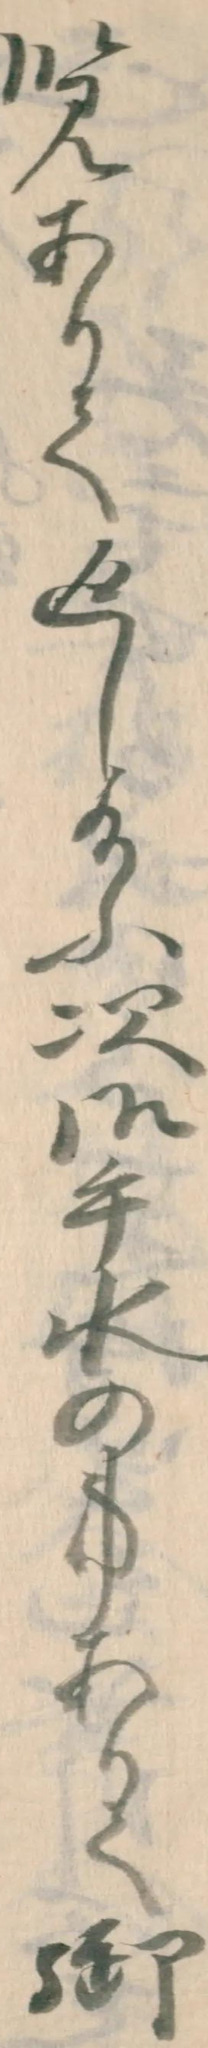覧ありて返し給ふ次御手水の事ありて御
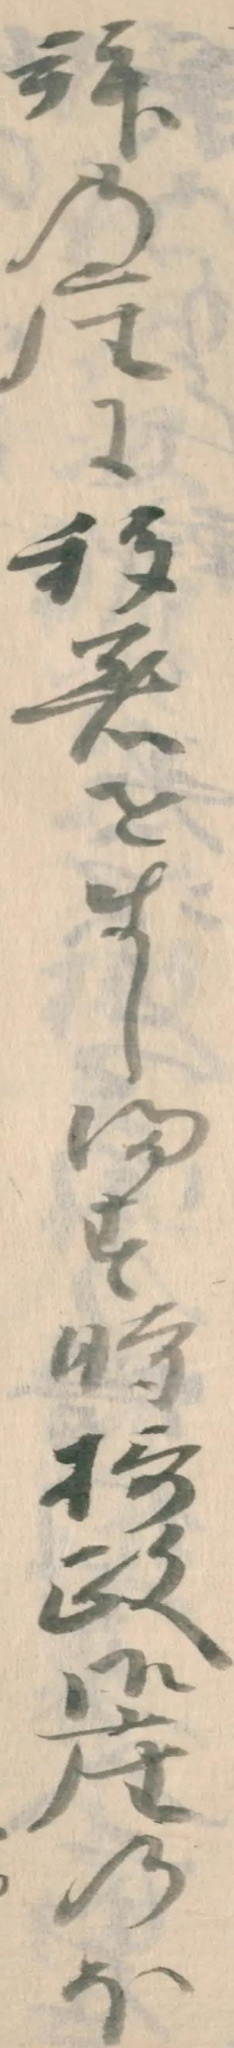拝の座に移着せまします時摂政御座のほ
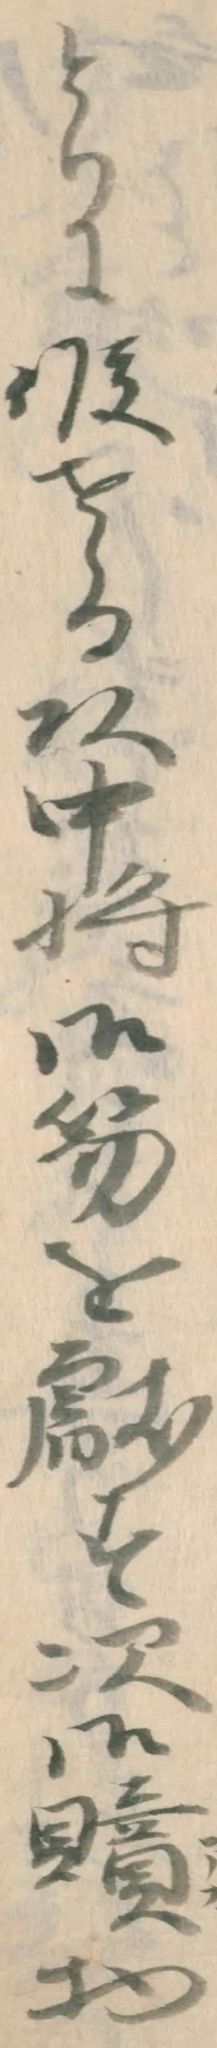とりに候せらる頭中将御笏を献す次御贖物
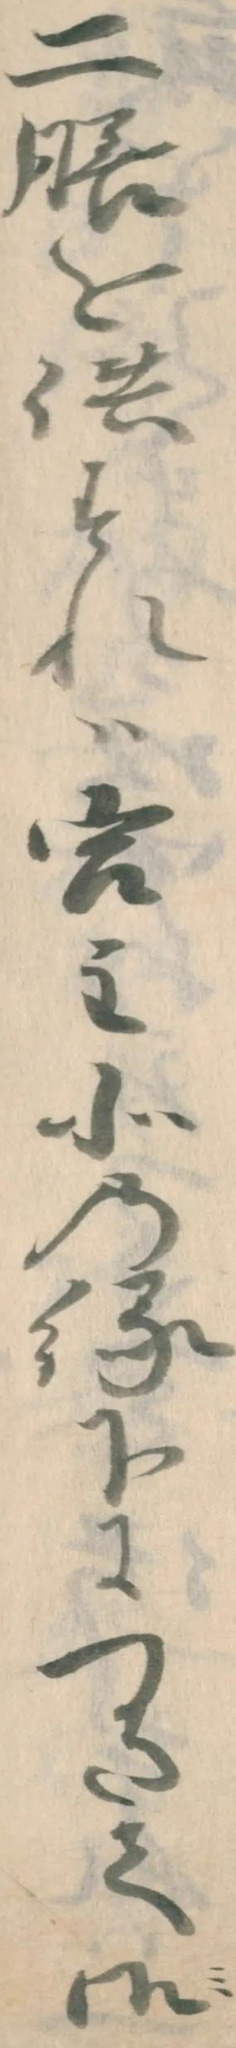二膳を供すれは宮主北の縁下につきて御

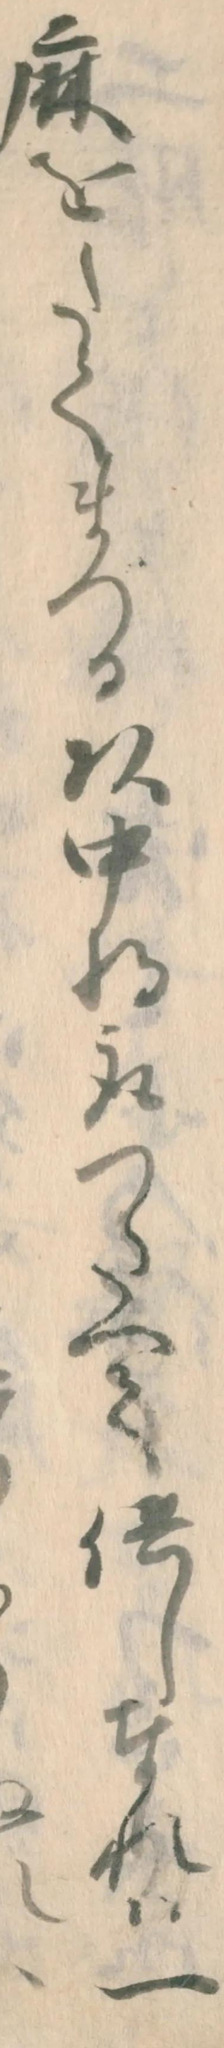麻をたてまつる頭中将取つたへて供し奉れは一
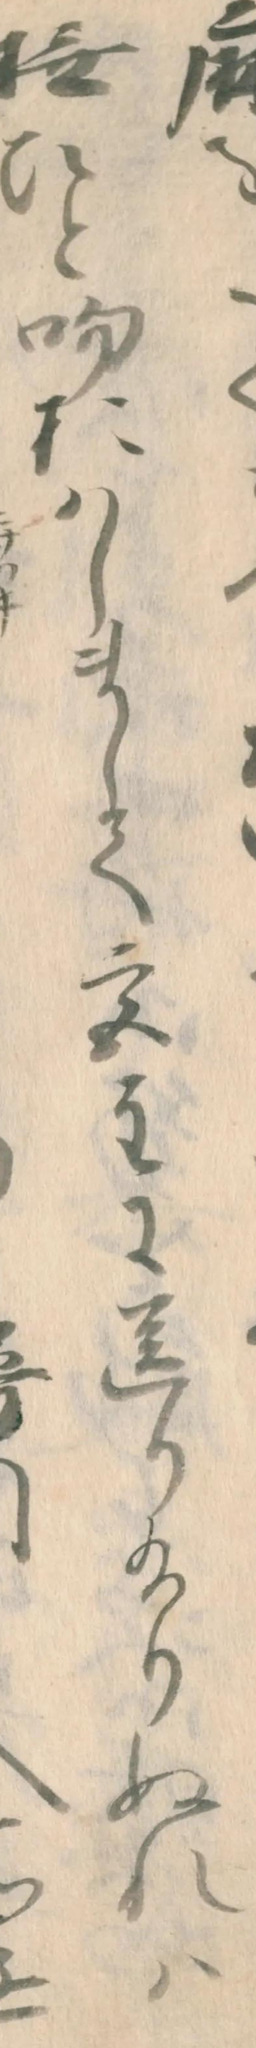撫ひと吻おはしまして宮主に送り給りぬれは
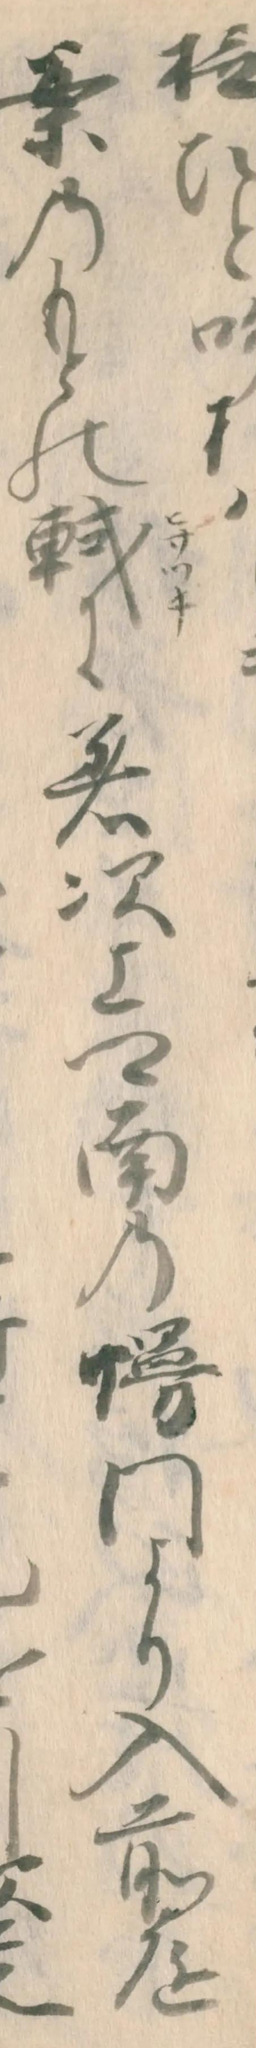案のもとの軾に着次上卿南の幔門より入前庭
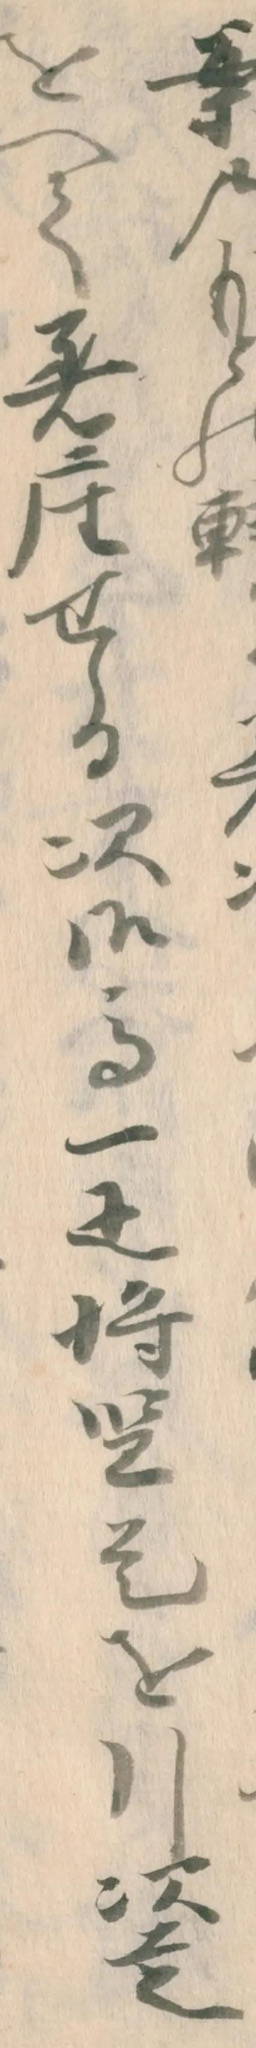をへて着座せる次御馬一疋将監是を引次走
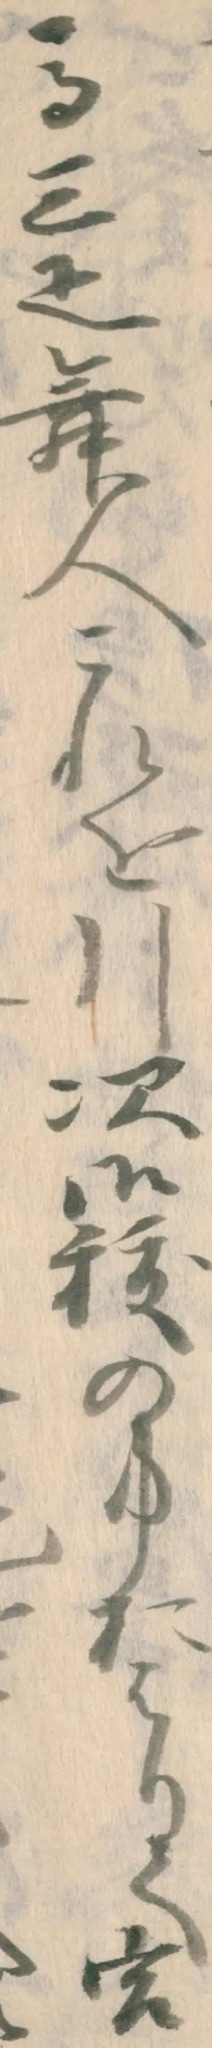馬三疋舞人これを引次御祓の事おはりて宮
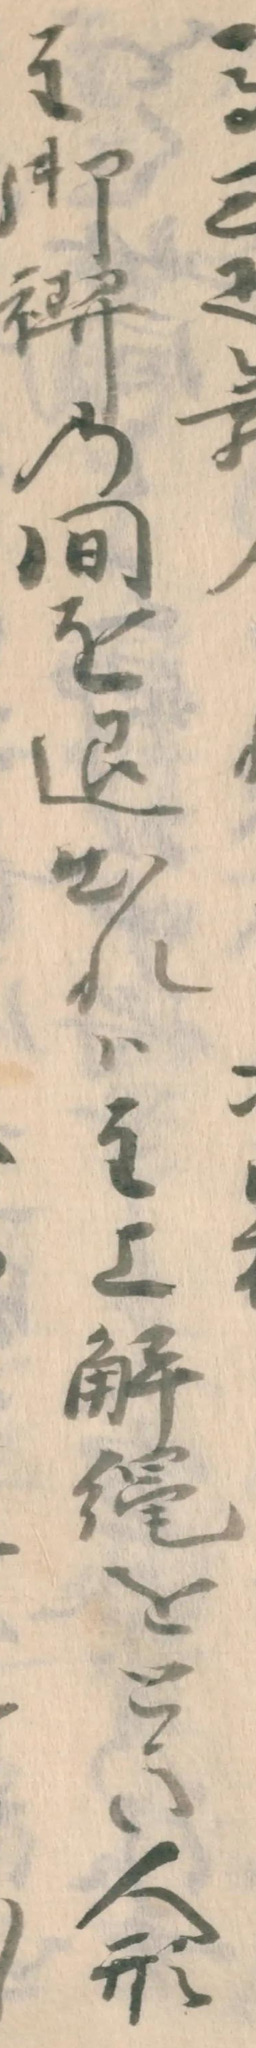主御禊の間を退出れは主上解縄をとき人形
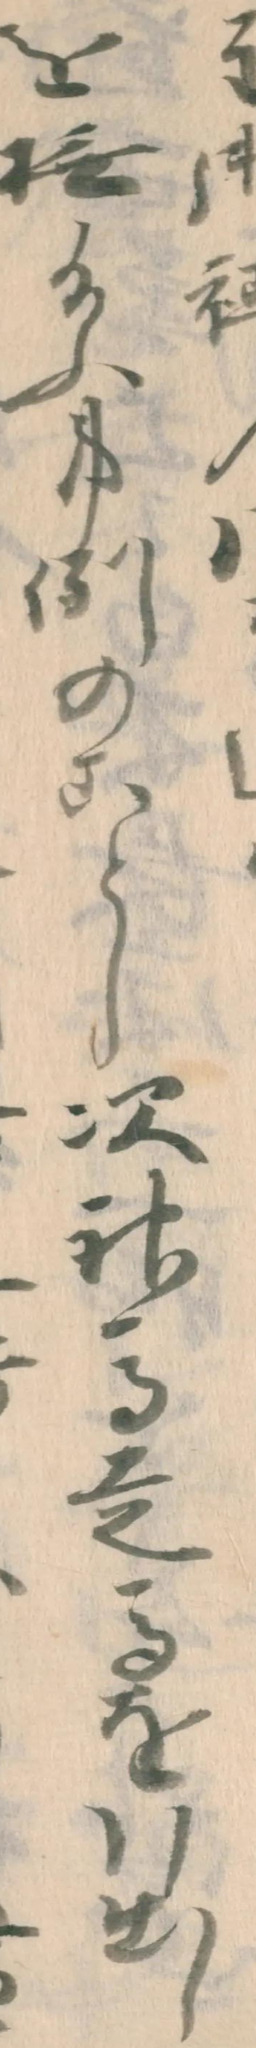を撫給ふ事例のことし次神馬走馬を引出し
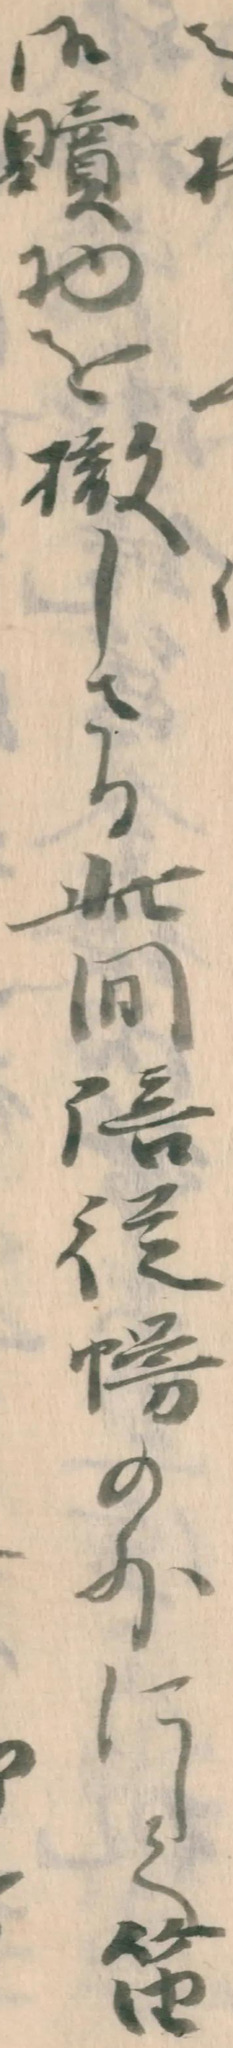御贖物を撤しさる此間陪従幔の外にして笛
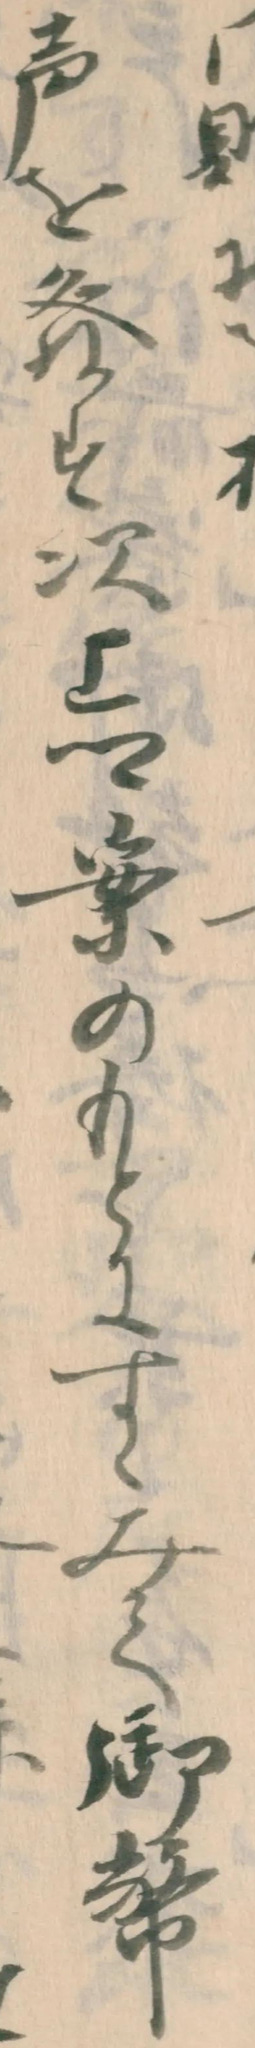声を発す次上卿案のもとにすゝみて御幣
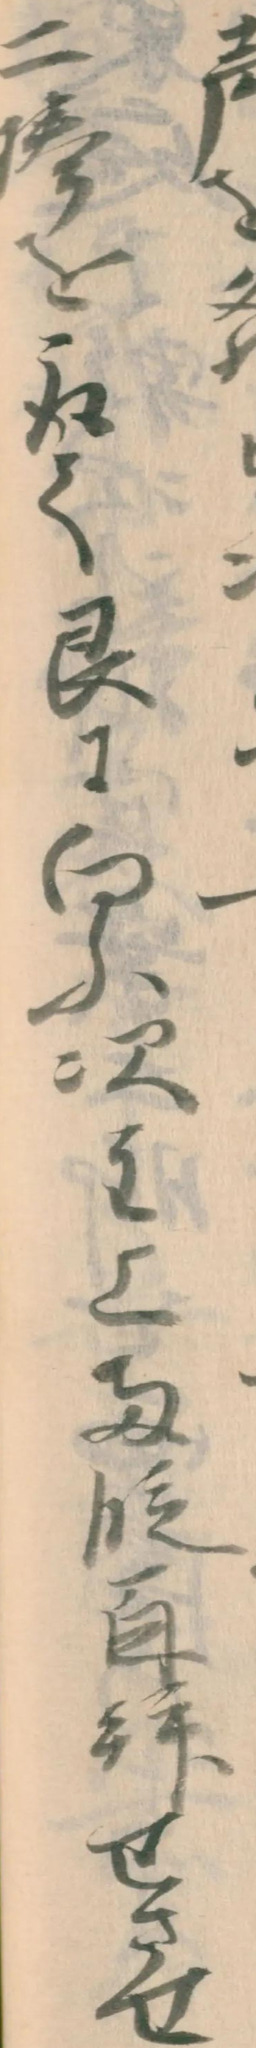二棒を取て艮に向ふ次主上両段再拝せさせ
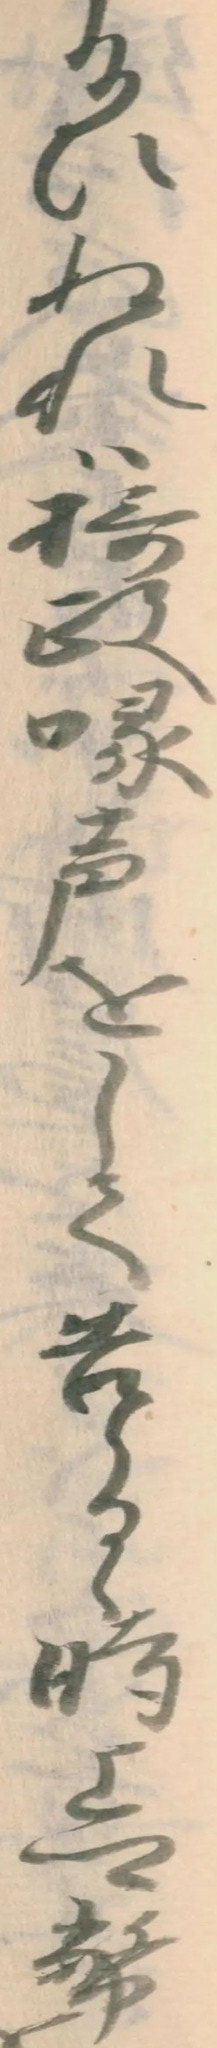給ひぬれは摂政喙声をして告らるゝ時上卿幣を
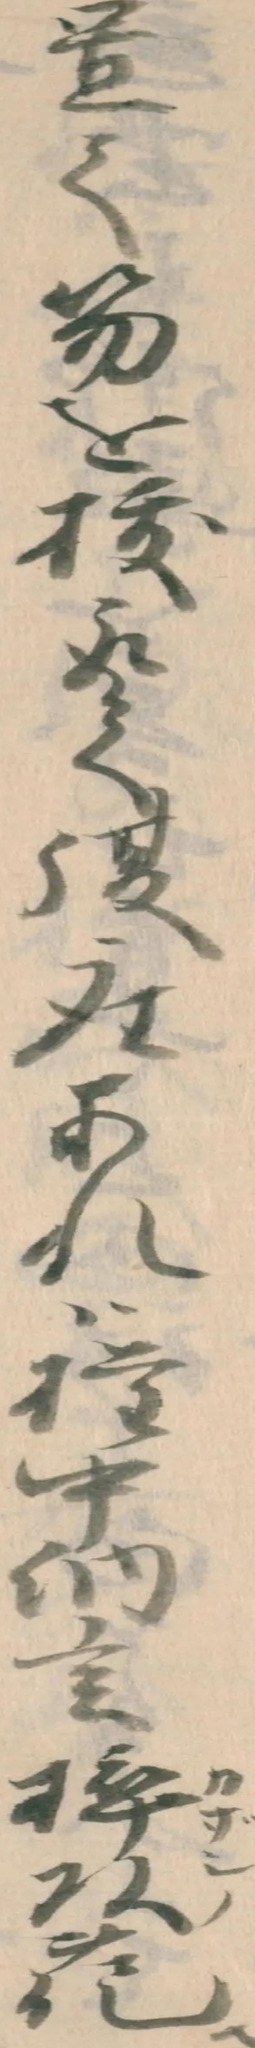置て笏を抜取て復座あれは権中納言梓頭花
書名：賀茂社記録. 第1冊
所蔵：国立国会図書館 National Diet Library, JAPAN
